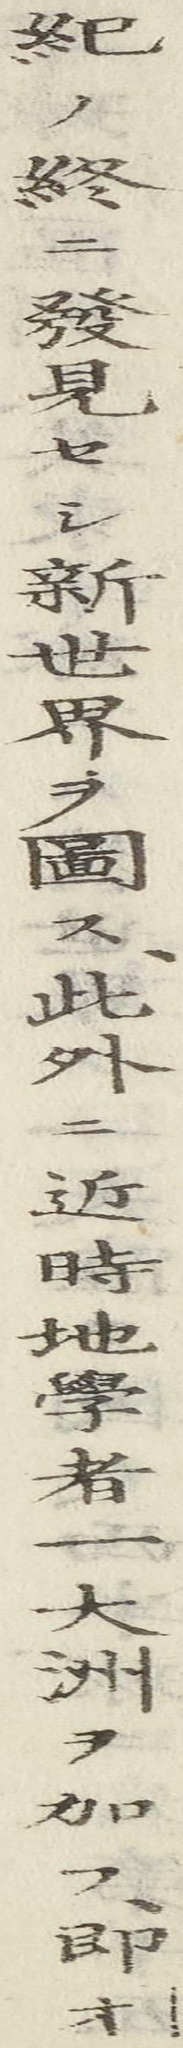紀ノ終ニ発見セシ新世界ヲ図ス、此外ニ近時地学者一大洲ヲ加フ、即オ
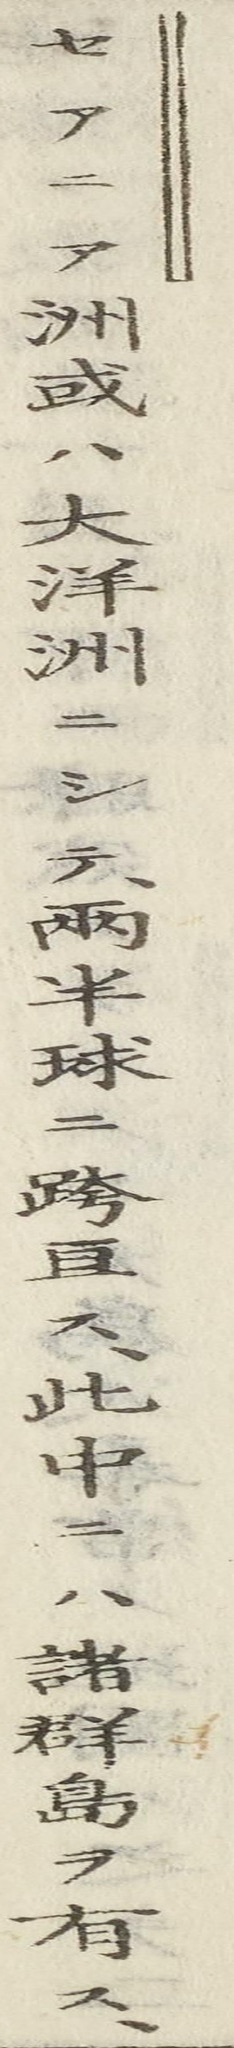セアニア洲或ハ大洋洲ニシテ、南半球ニ跨亘ス、此中ニハ諸群島ヲ有ス、
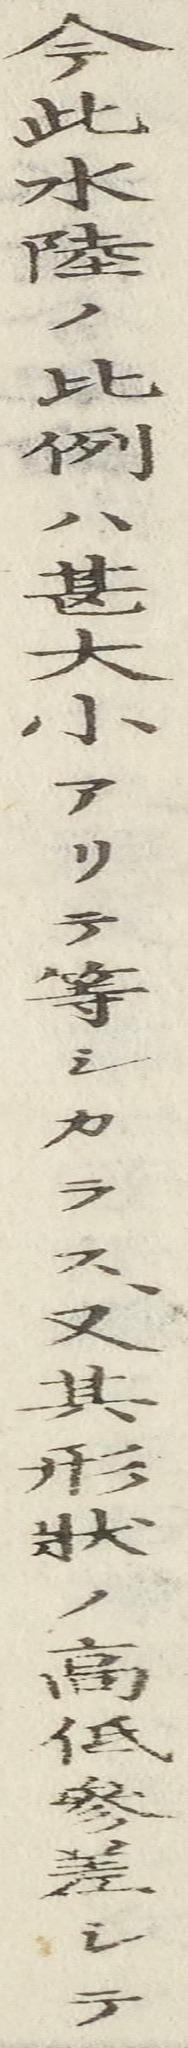今此水陸ノ比例ハ甚大小アリテ等シカラス、又其形状ノ高低参差シテ
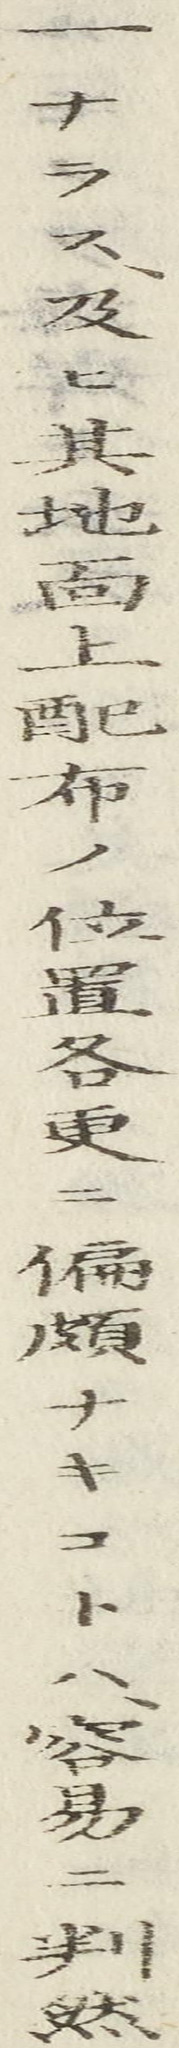一ナラス、及ヒ其地面上配布ノ位置各更ニ偏頗ナキコトハ、容易ニ判然
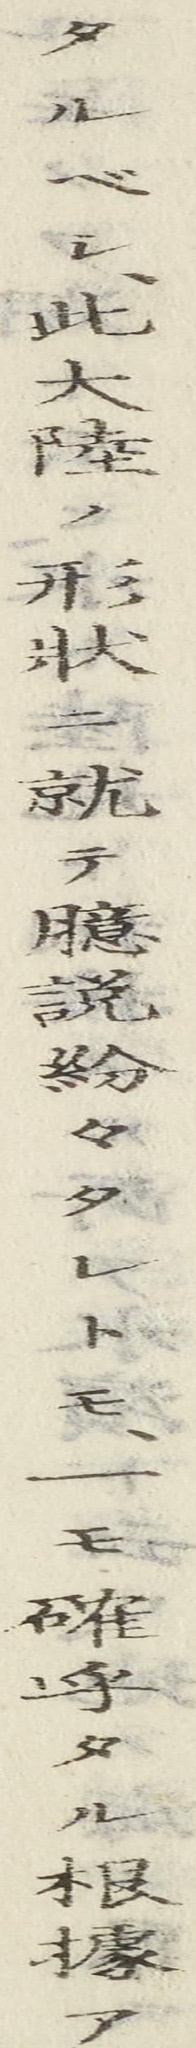タルベシ、此大陸ノ形状ニ就テ臆説紛々タレトモ、一モ確乎タル根拠ア
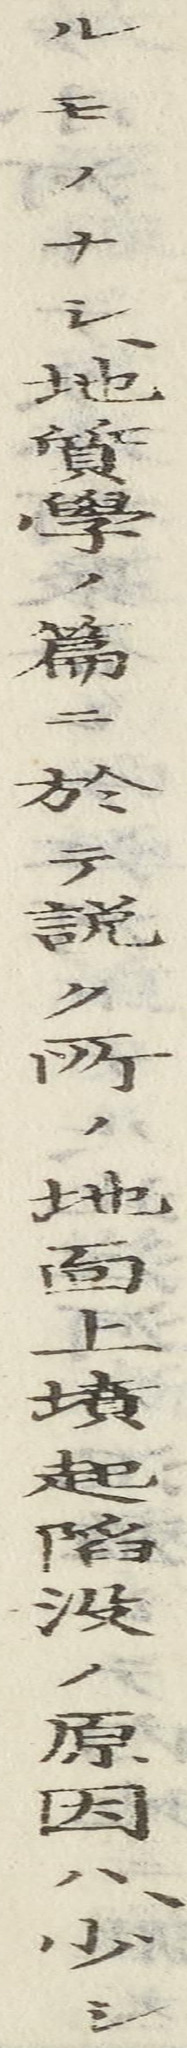ルモノナシ、地質学ノ篇ニ於テ説ク所ノ地面上墳起陥没ノ原因ハ、少シ
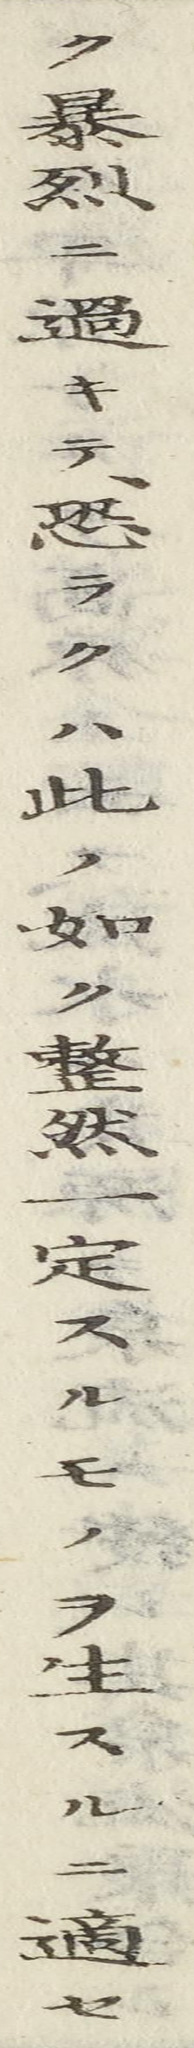ク暴烈ニ過キテ、恐ラクハ此ノ如ク整然一定スルモノヲ生スルニ適セ
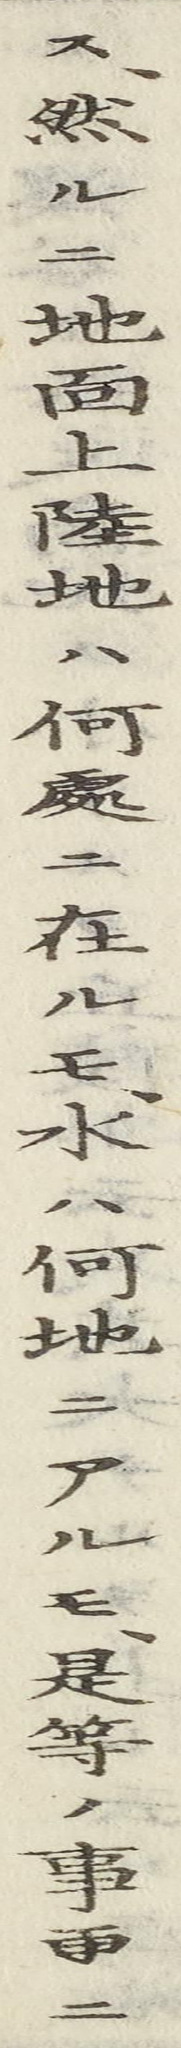ス、然ルニ地面上陸地ハ何処ニ在ルモ、水ハ何地ニアルモ、是等ノ事更ニ
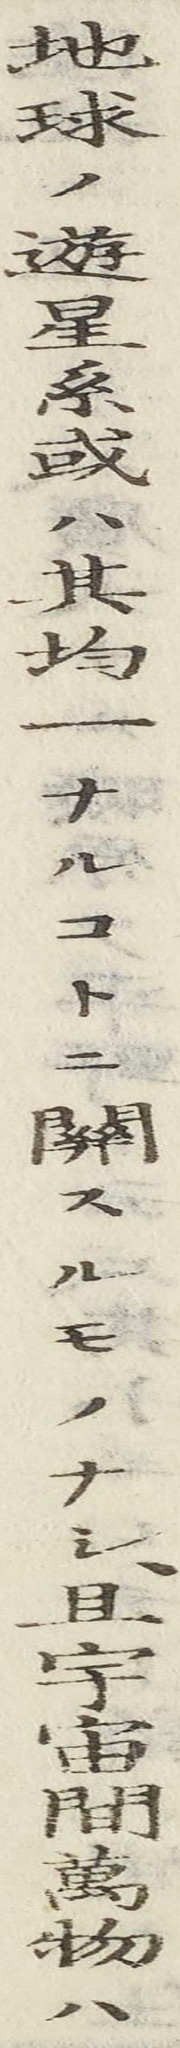地球ノ遊星系或ハ其均一ナルコトニ関スルモノナシ、且宇宙間万物ハ
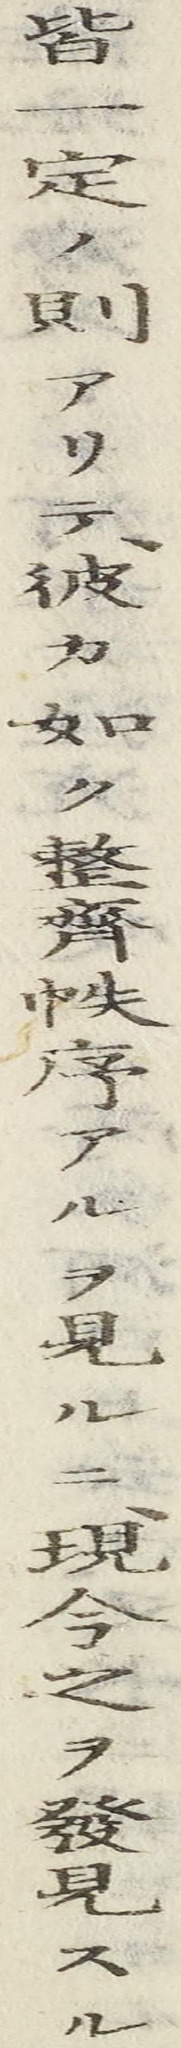皆一定ノ則アリテ、彼カ如ク整斉帙序アルヲ見ルニ、現今之ヲ発見スル
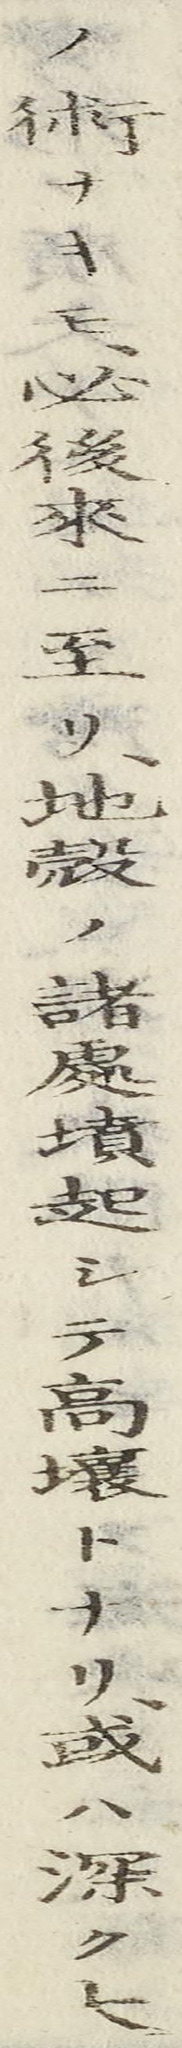ノ術ナキモ、必後来ニ至リ、地殻ノ諸処墳起シテ高壌トナリ、或ハ深ク大
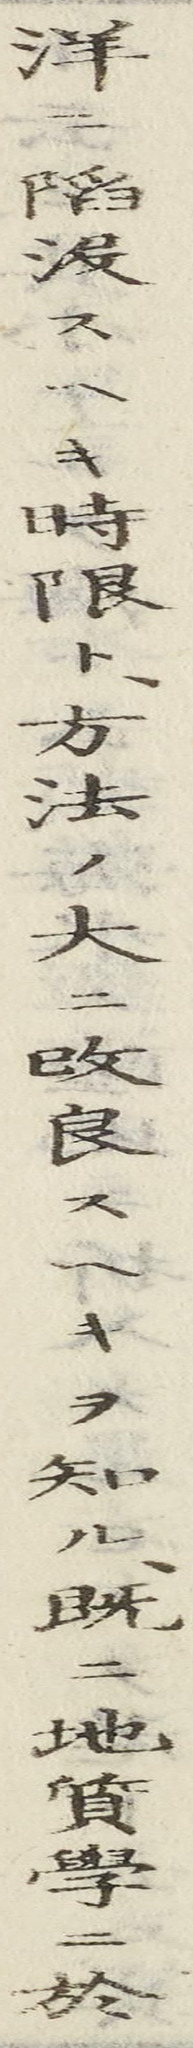洋ニ陥没スヘキ時限ト、方法ノ大ニ改良スヘキヲ知ル、既ニ地質学ニ於
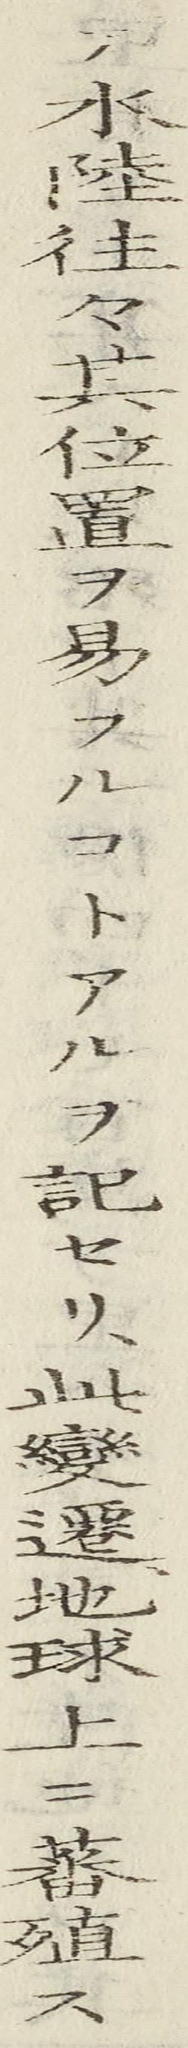テ水陸往々其位置ヲ易フルコトアルヲ記セリ、此変遷、地球上ニ蕃殖ス
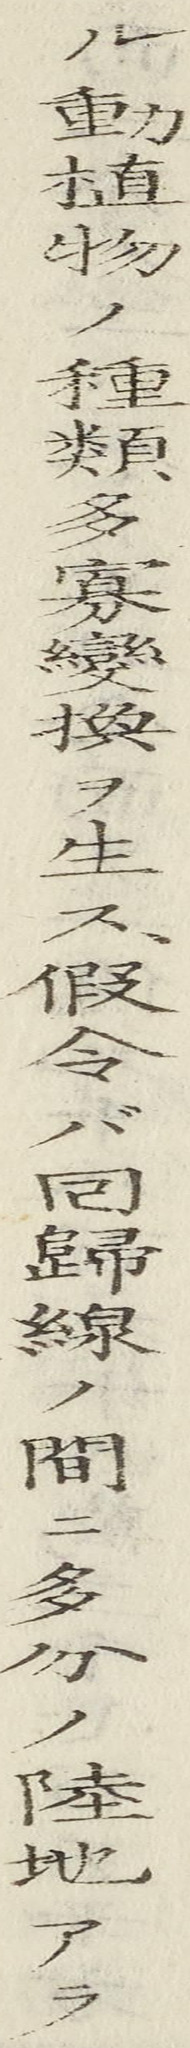ル動植物ノ種類多寡変換ヲ生ス、仮令バ回帰線ノ間ニ多分ノ陸地アラ
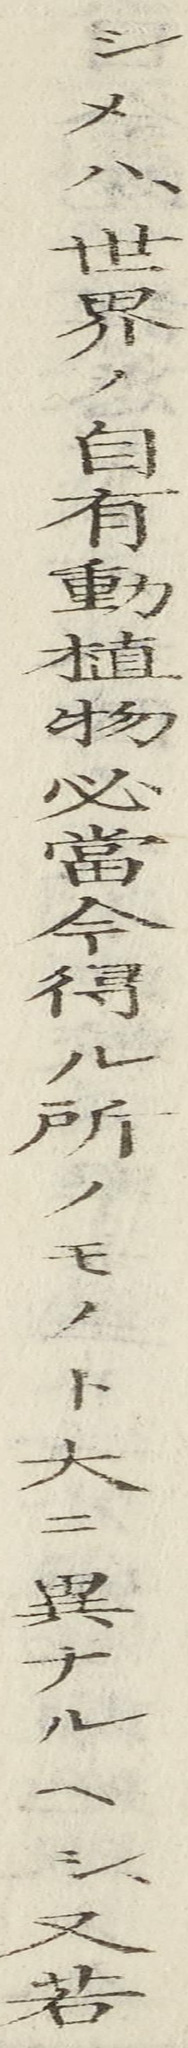シメハ、世界ノ自有動植物必当今得ル所ノモノト大ニ異ナルヘシ、又若
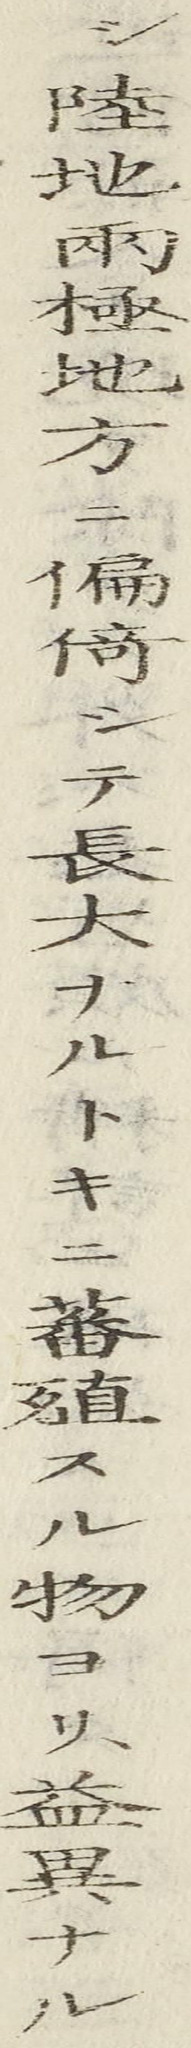シ陸地両極地方ニ偏倚シテ長大ナルトキニ蕃殖スル物ヨリ、益異ナル
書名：百科全書　地文學　全
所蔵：東京大学地震研究所図書室 Earthquake Research Institute Library, The University of Tokyo, JAPAN
